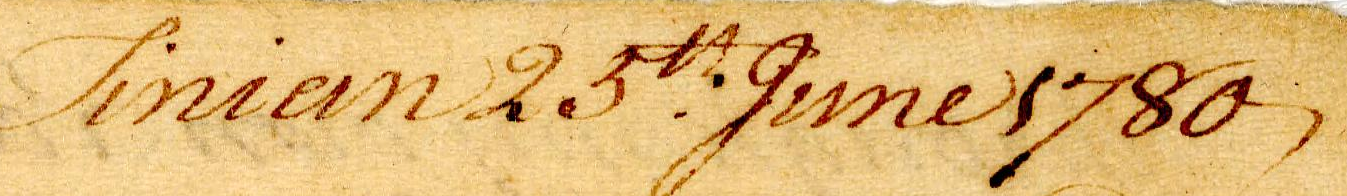Tinian 25^th June 1780
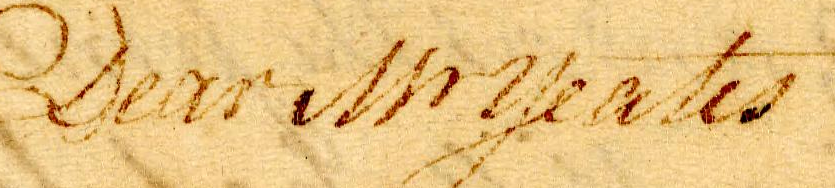Dear M^r Yeates
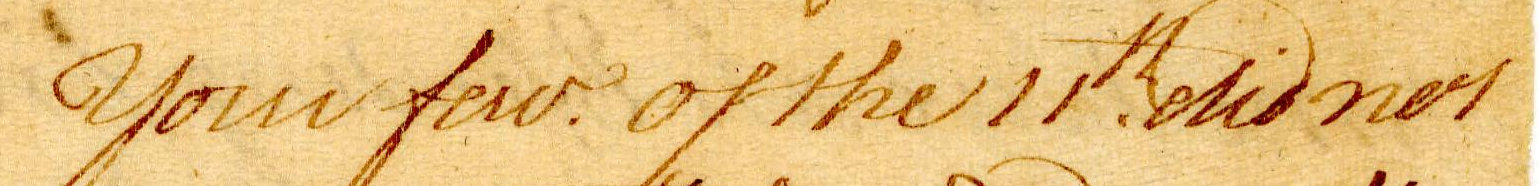Your fav^r. of the 11^th did not
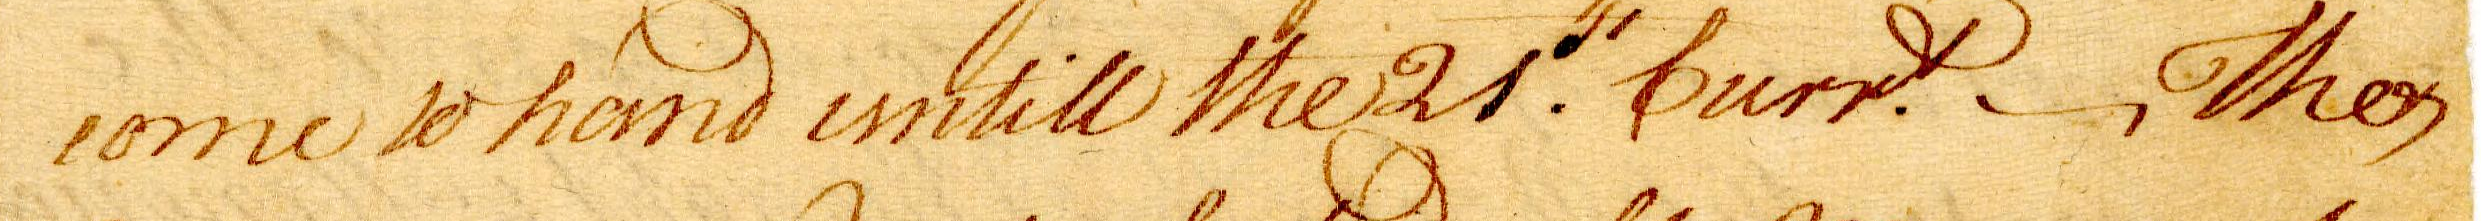come w hand untill the 21^st Curr^t.- They
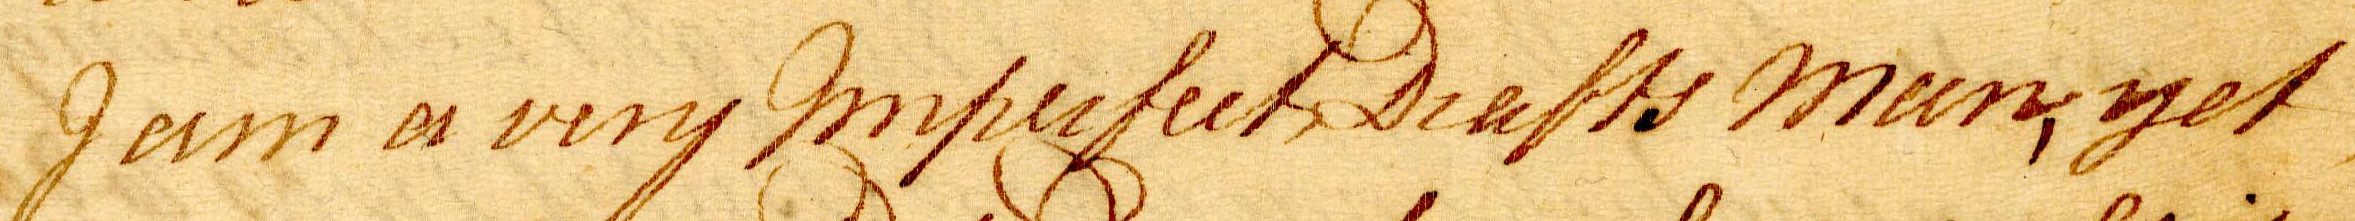I am a very imperfect Drafts man, yet
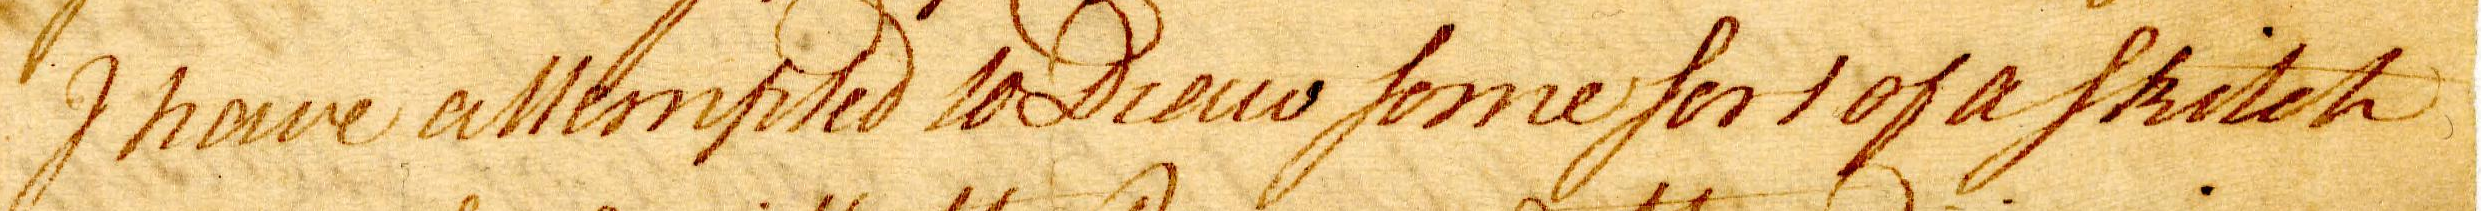I have attempted to Draw some sort of a skitch
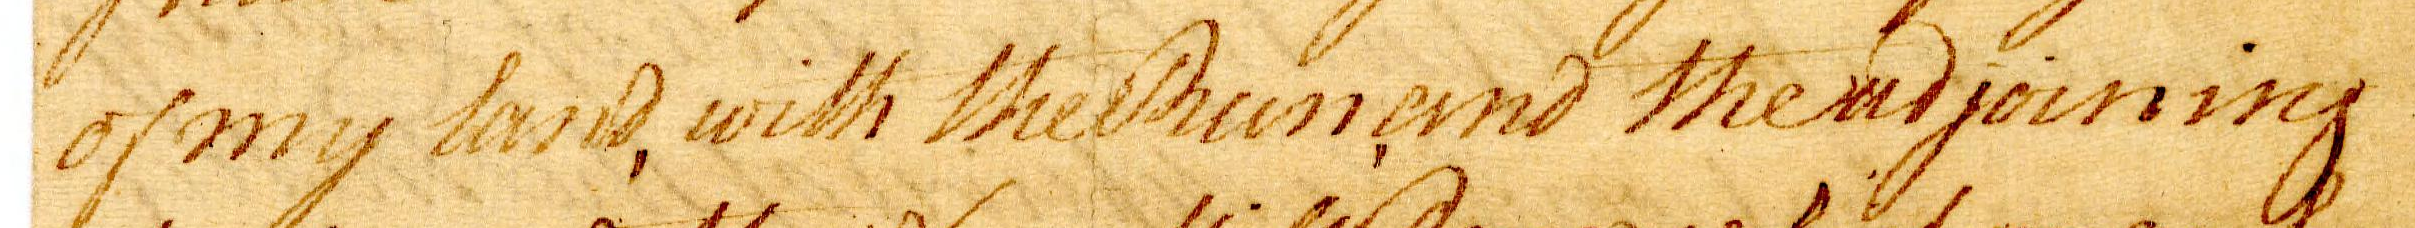of my land, with the Run and the adjoining
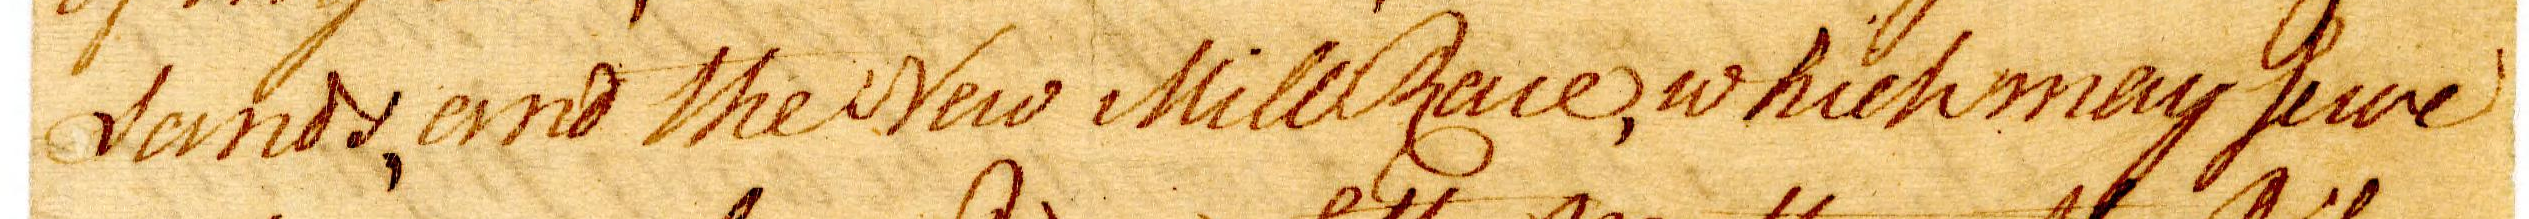Sands, and the New Mill Race, which may Serve
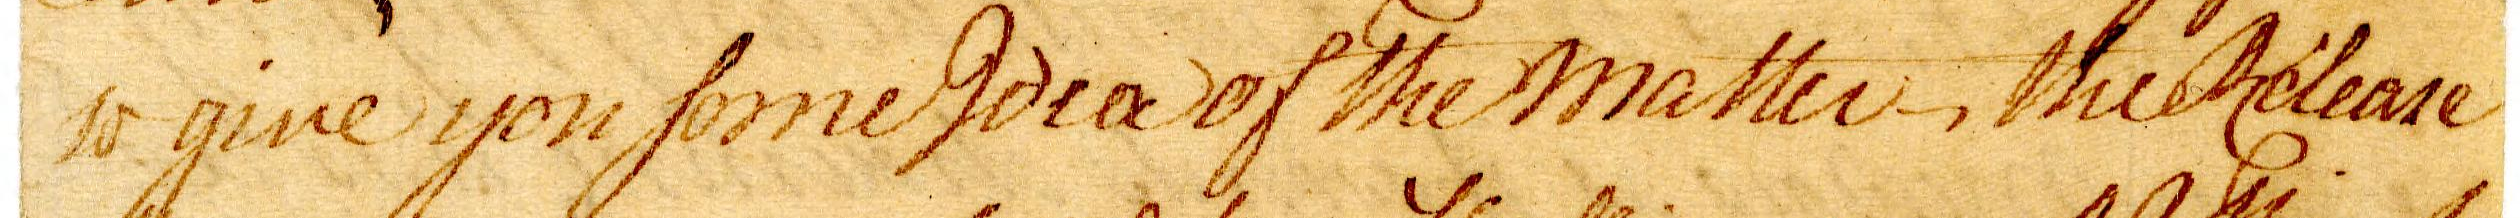to give you some Idea of the matter, the Release
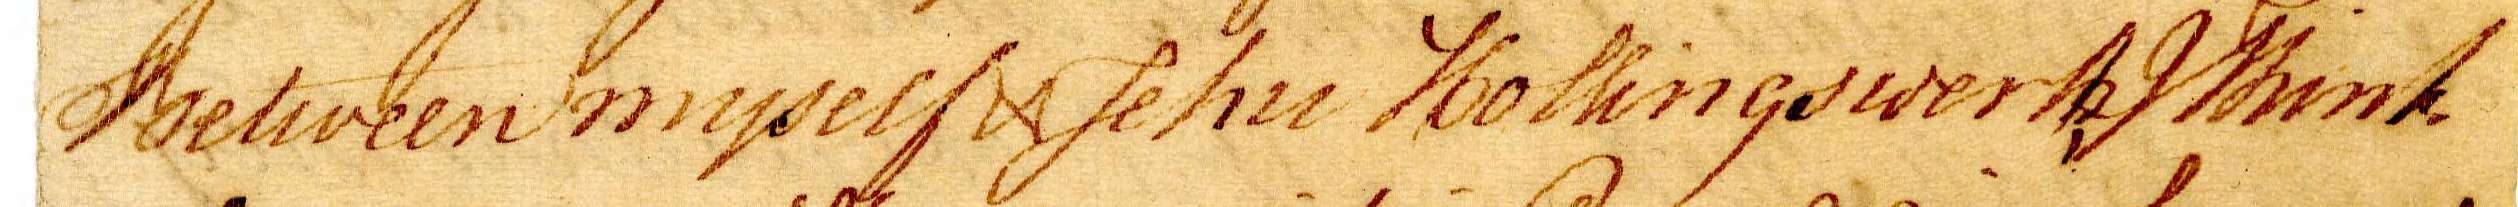Between myself & John Hollingsworth I think
